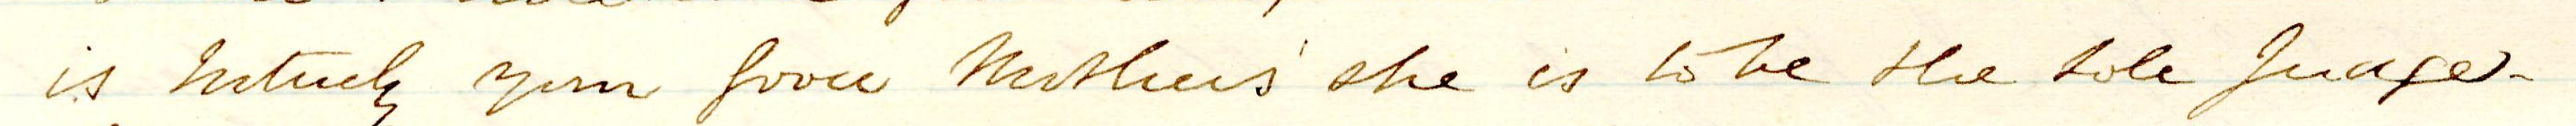is Intirely you good Mothers she is to be the sole Judge-
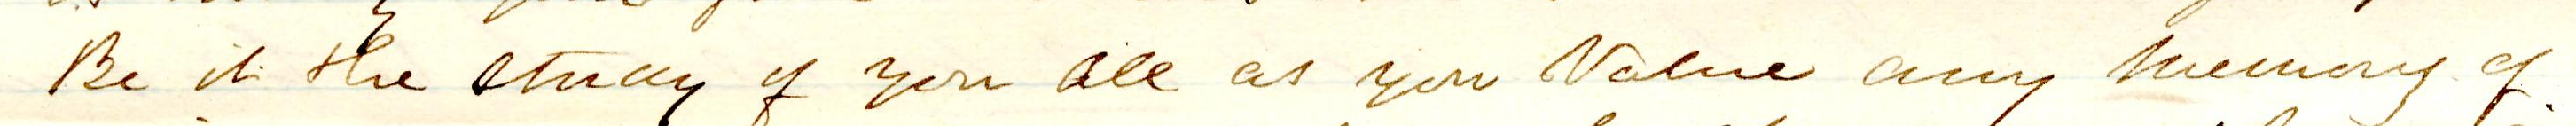Be it the stidy of you all as you Value any memory of
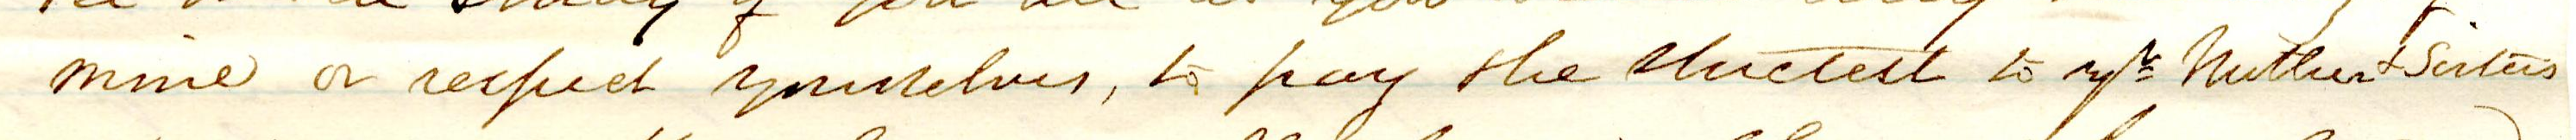mine or respect yourselves, to pay the strictest to y^r Mother & Sisters
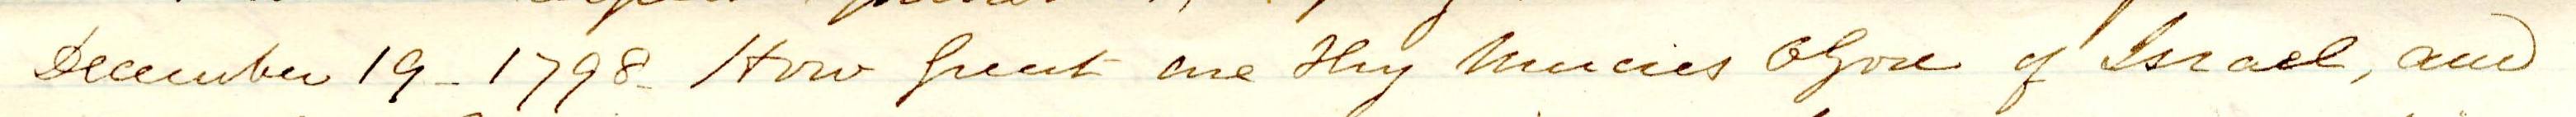December 19 1798. How great are thy mercies O God of Israel, and
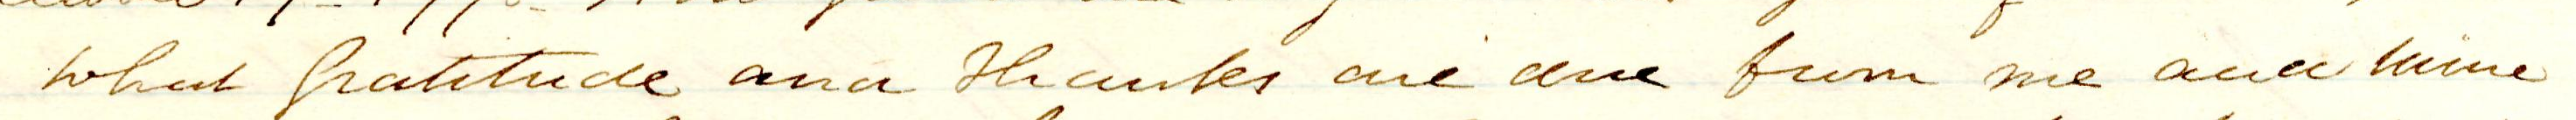what gratitude and Thanks are due from me and mine
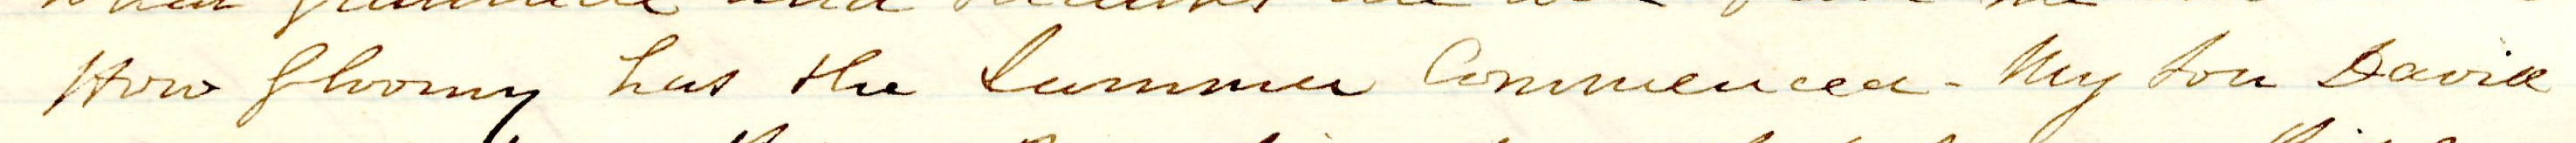how gloomy has the summer commenced- My son David
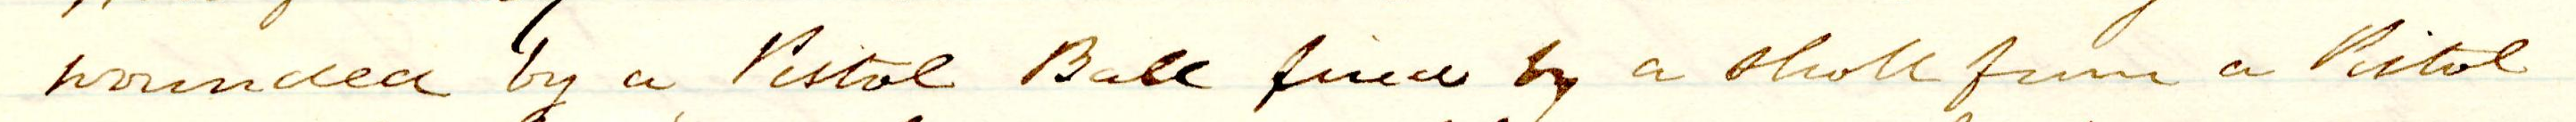wounded by a Pistol Ball fired by a shott from a Pistol
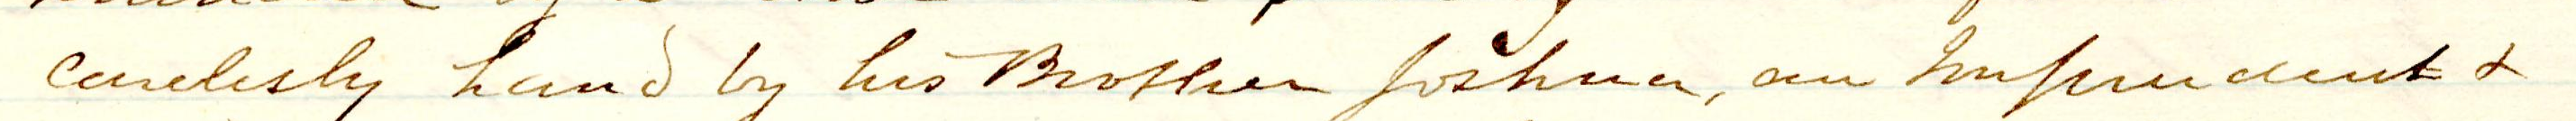carelesly hand by his Brother Joshua, an Imprudent &
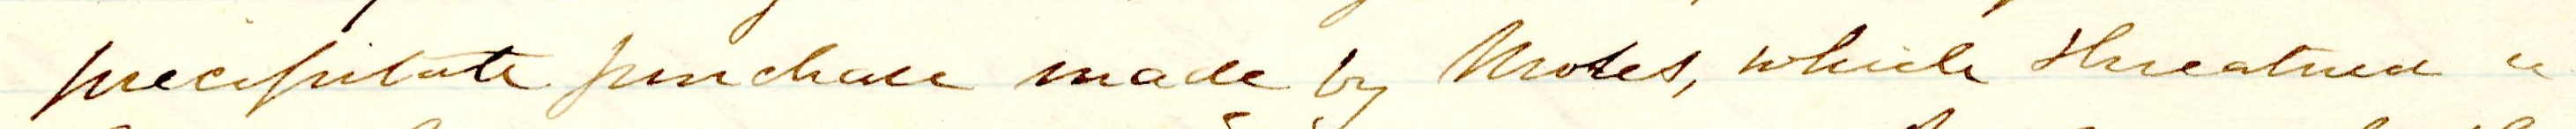precipitate purchase made by Moses, which threatened a
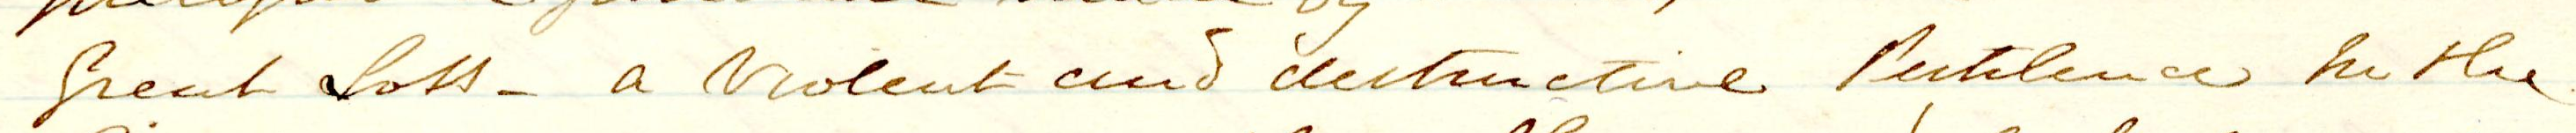Great Loss.- a violent and deterrence Petulence In the
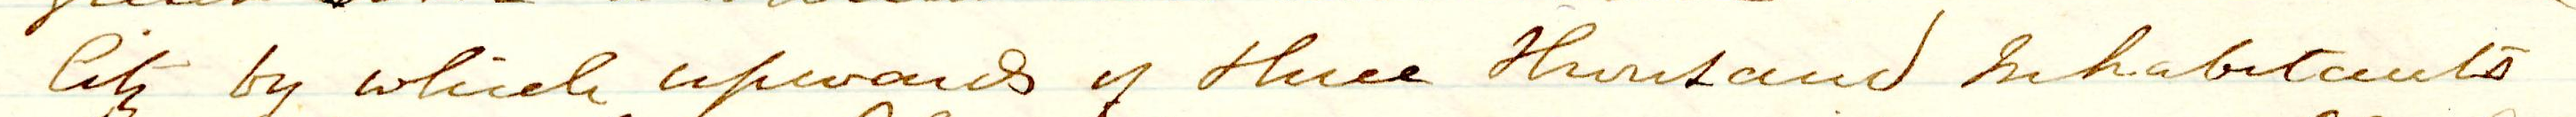City by which upwards of three hundred inhabitants
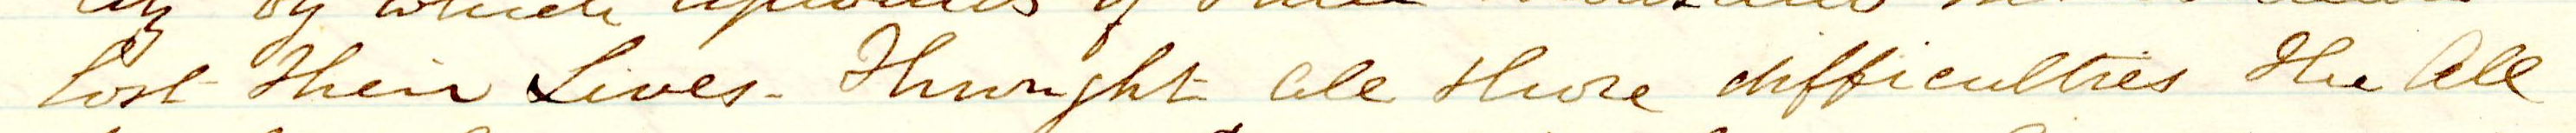lost their Lives. Thought all house difficulties the All
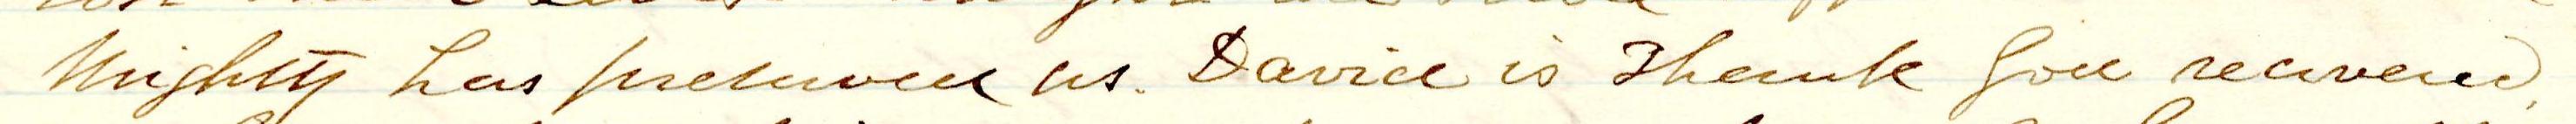mighty has preserved us David is the Thank God recovered
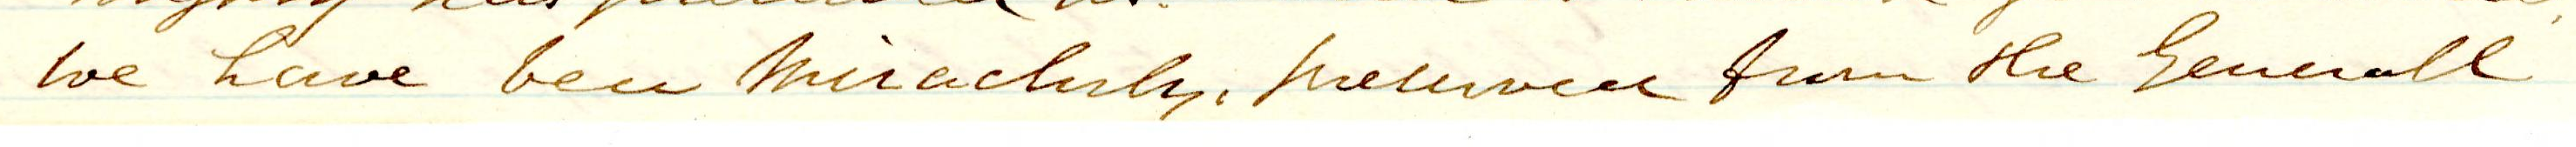we have been miraclusly preserved from the Generall
